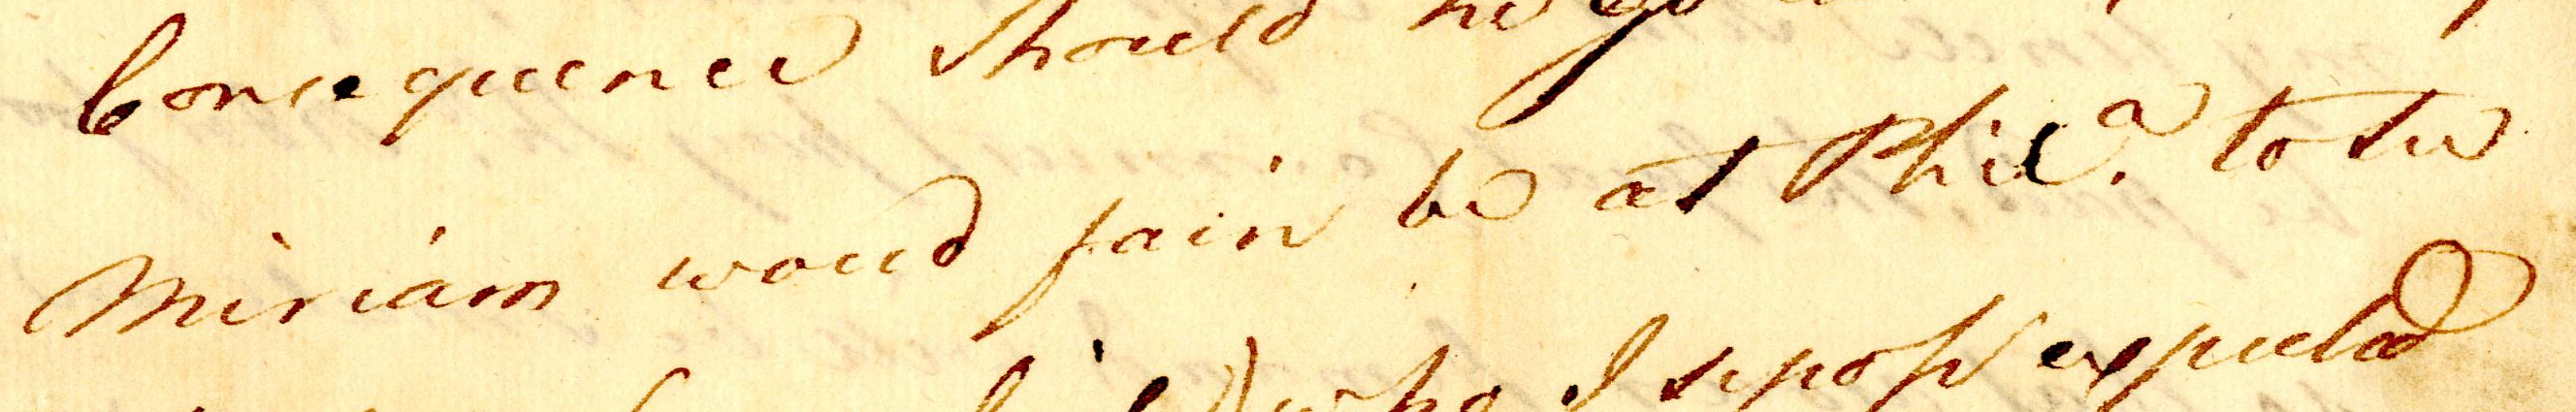Miriam woud pain be at Phil^a. to see
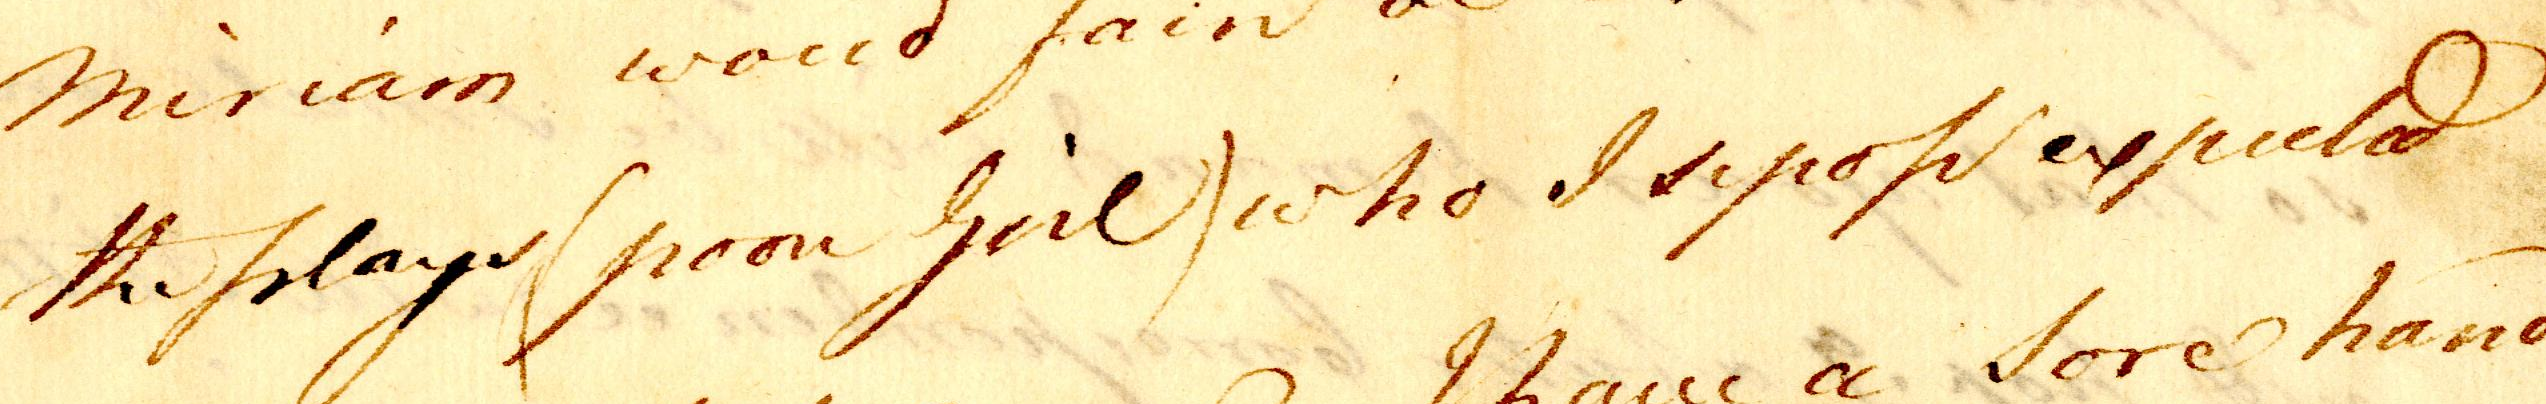the plays (poor Girl) who I sepose expected
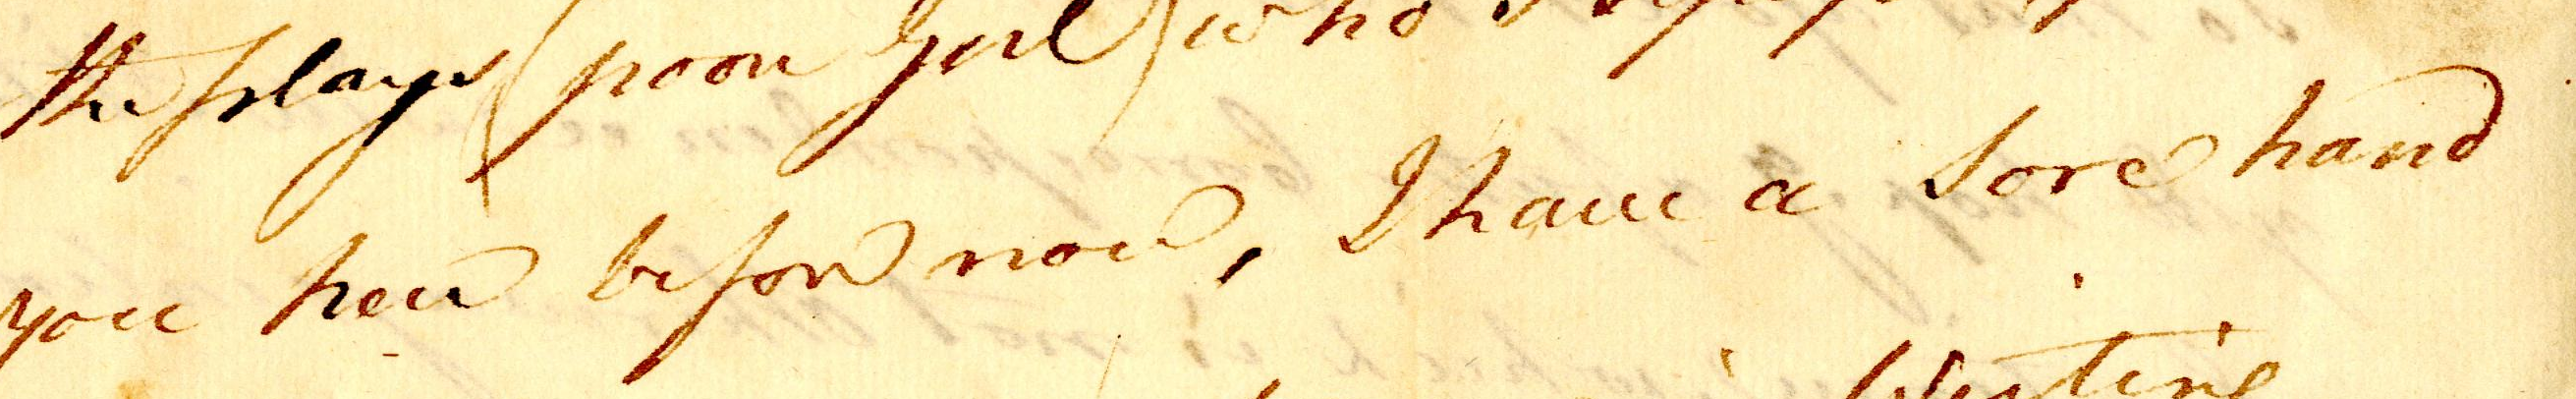you here before now, I have a sore hand
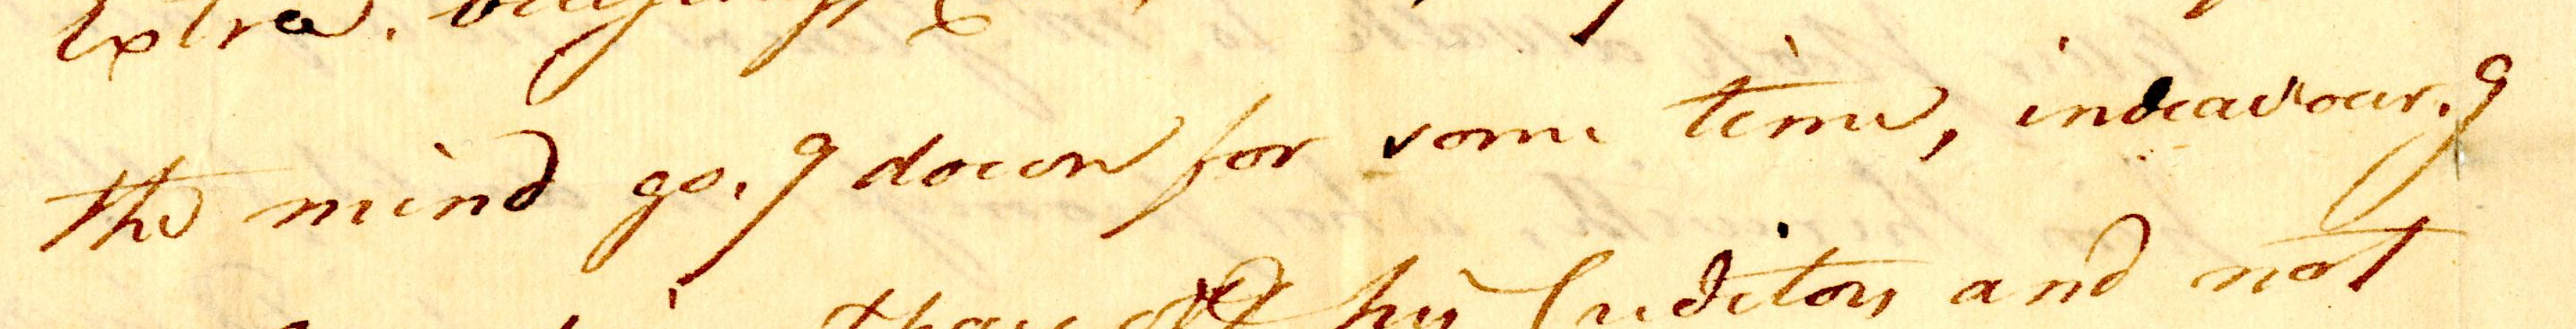the mind go.^g down for some time, indeavour.g
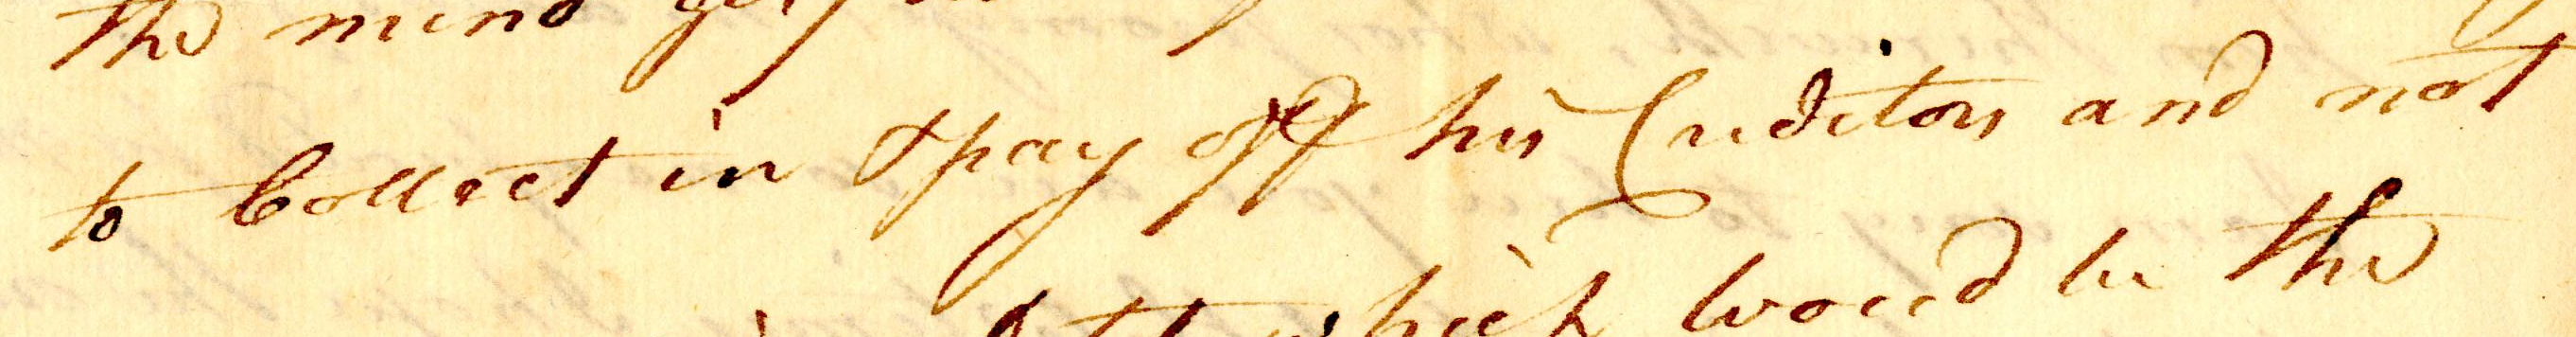to Collect in & pay off his Credits and not
